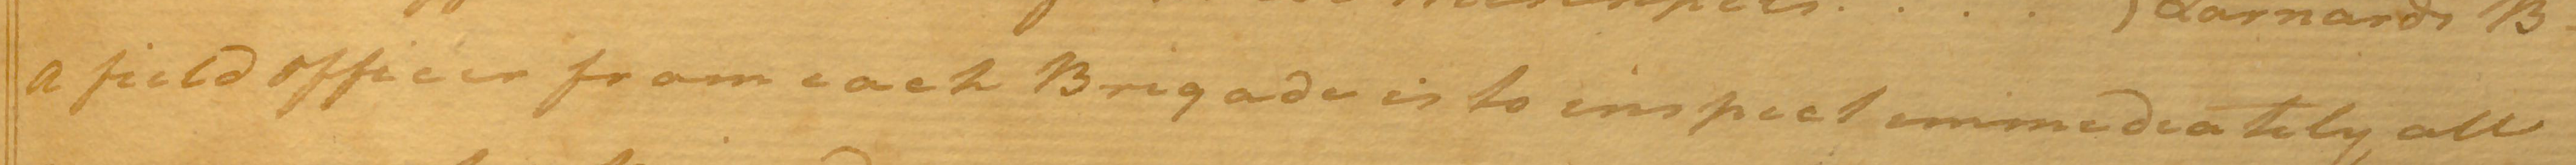a field officer from each Brigade is to inspect immediately all
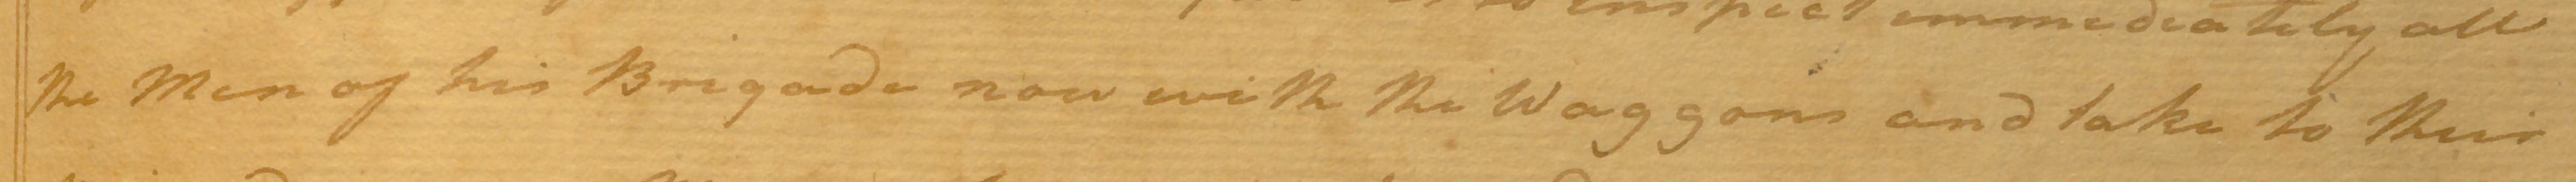the Men of his Brigade now with the Waggons and take to their
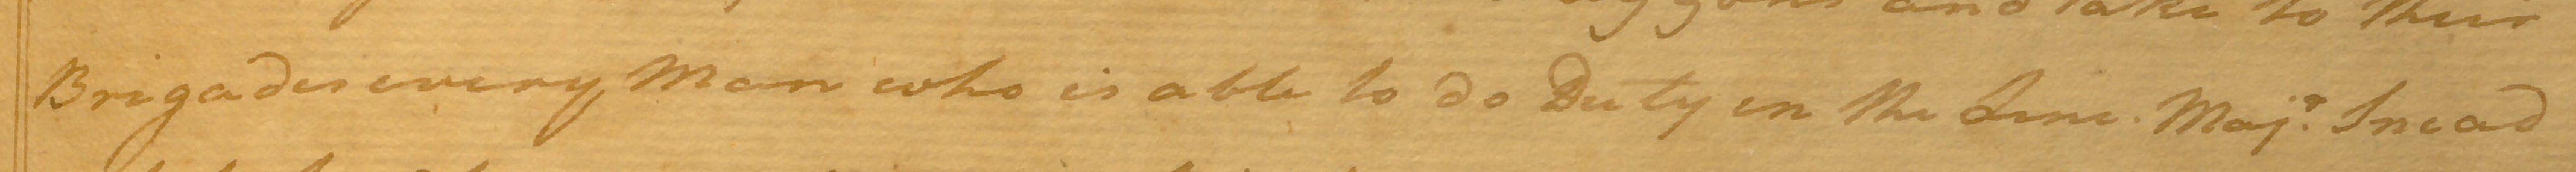Brigades every Man who is able to do Duty in the Line. Maj^r. Snead
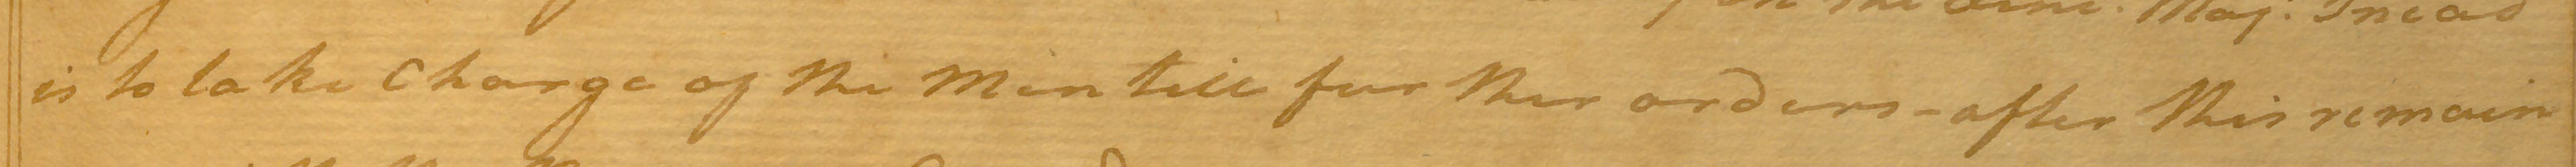is to take Charge of the Men till further orders- after this remain
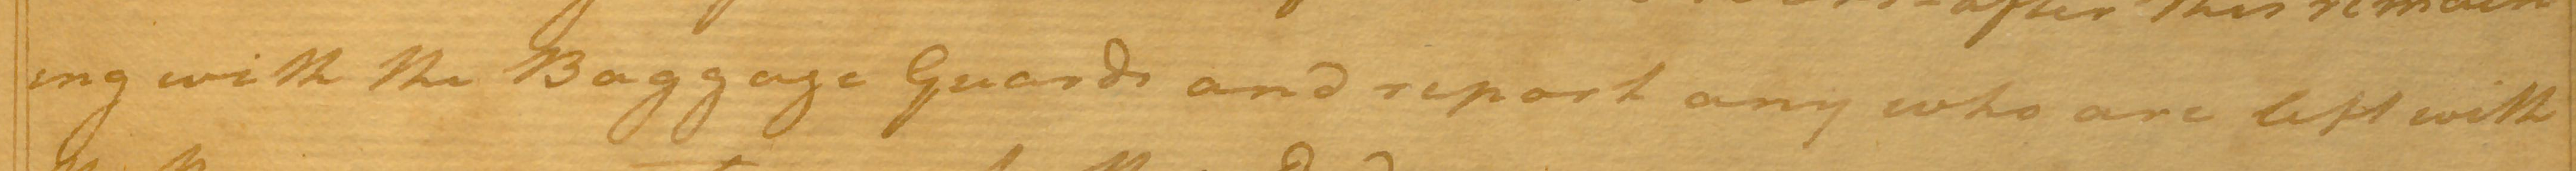ing with the Baggage Guards and report any who are left with
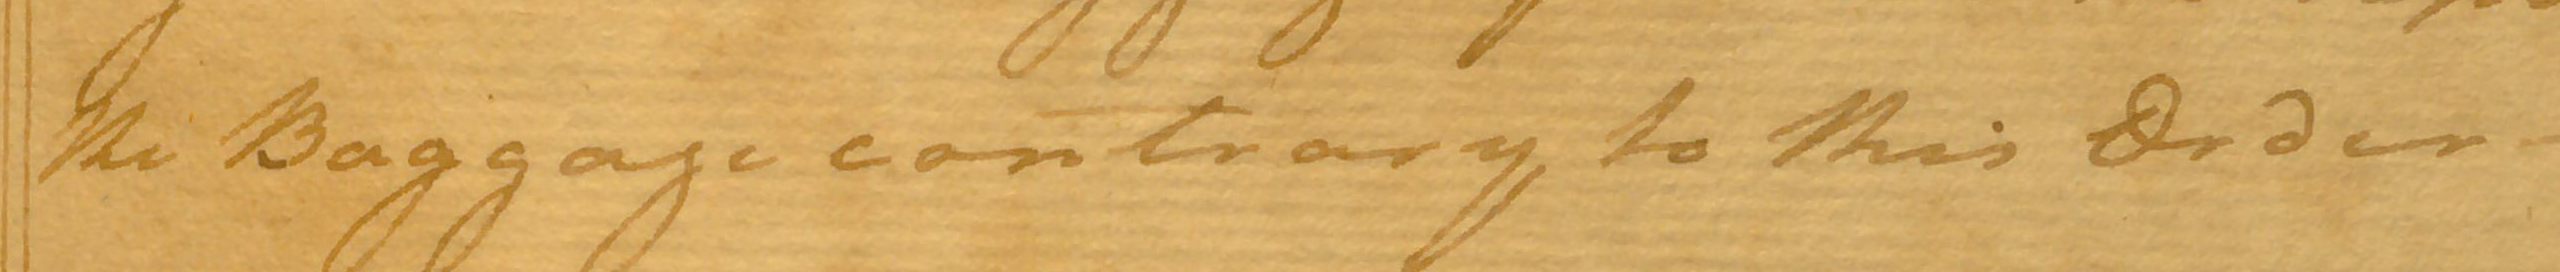the Baggage contrary to this Order-
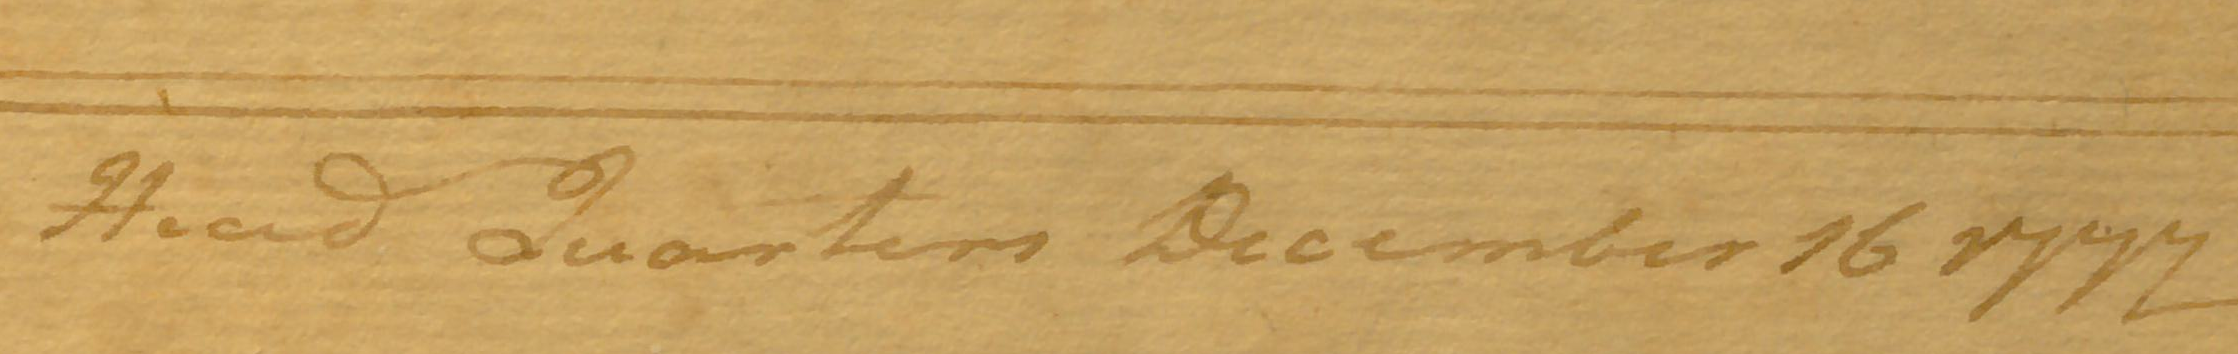Head Quarters December 16 1777
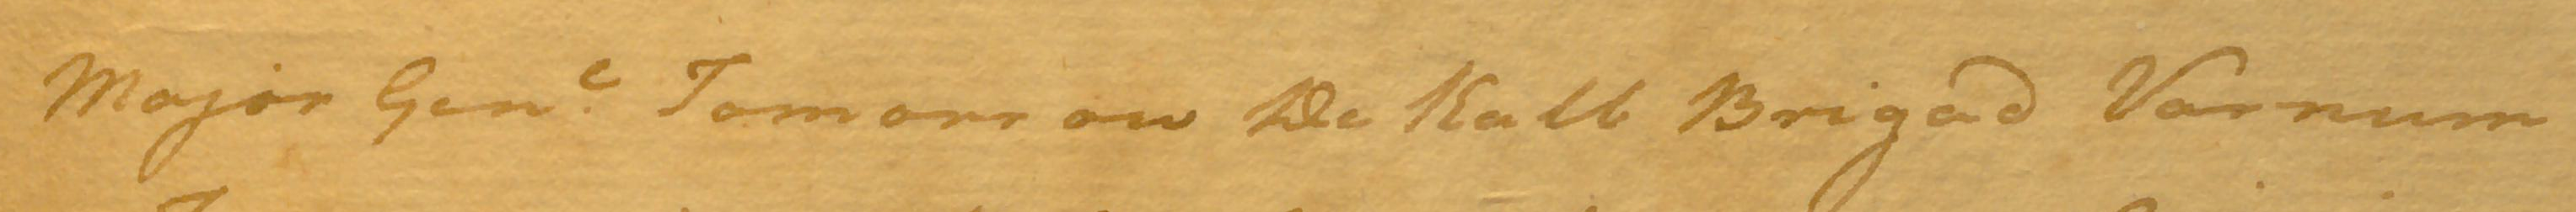Major Gen^l. Tomorrow De Kalb Brigad Varnum
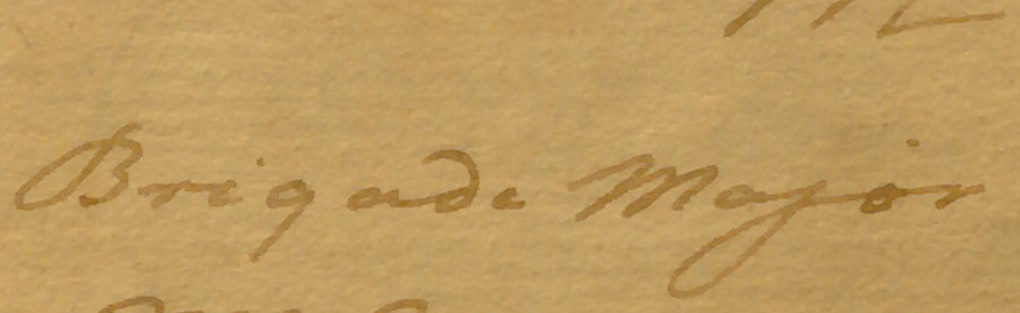Brigade Major
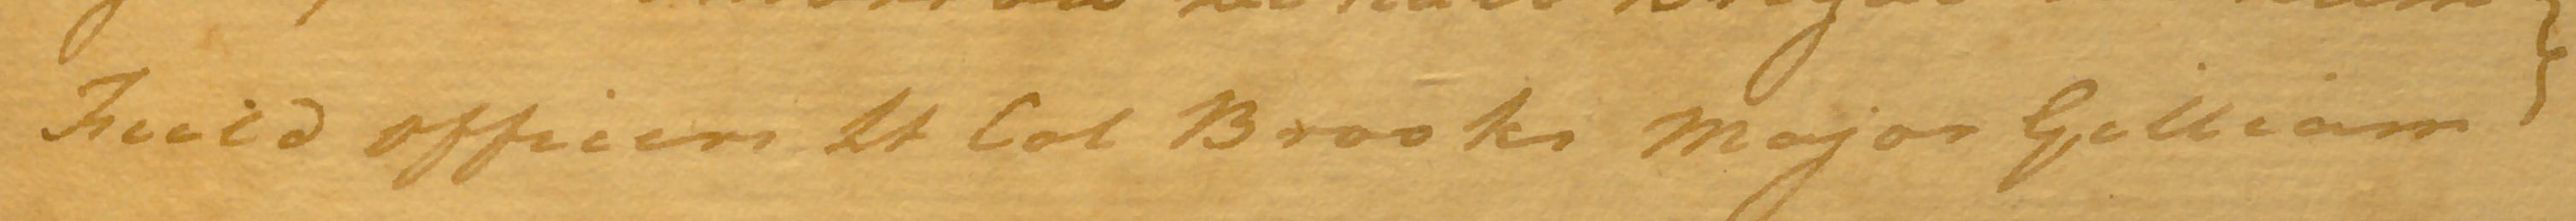Field Officers Lt Col Brooks Major Gilliam
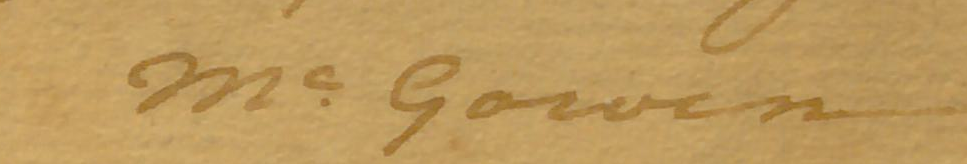M^c.Gowen
